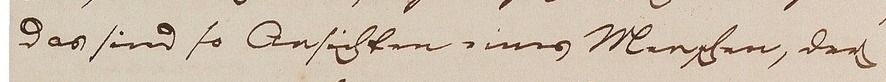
das sind so Ansichten eines Menschen, der
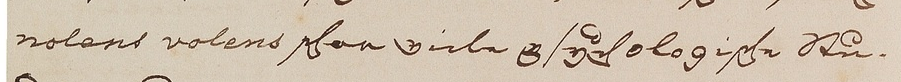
nolens volens schon viele psychologische Stu-
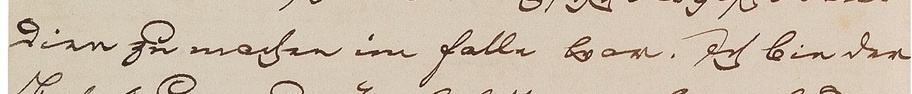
dien zu machen im Falle war. Ich bin der
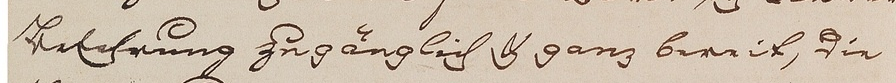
Belehrung zugänglich & ganz bereit, die
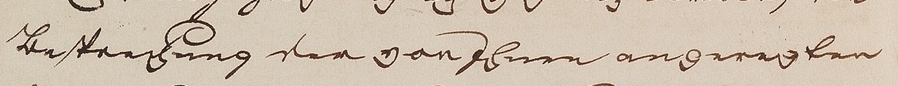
Besprechung der von Ihnen angeregten
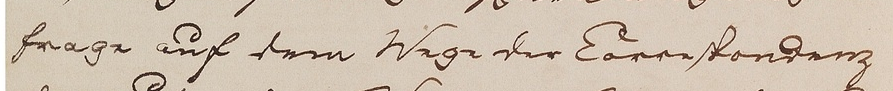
Frage auf dem Wege der Correspondenz
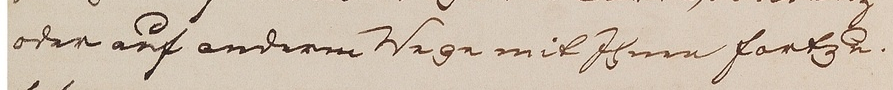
oder auf anderm Wege mit Ihnen fortzu-
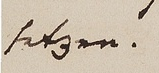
setzen.
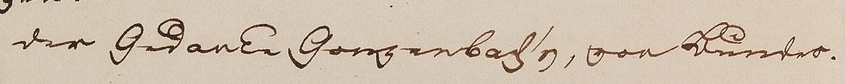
Der Gedanke Gonzenbach's, von Bundes
